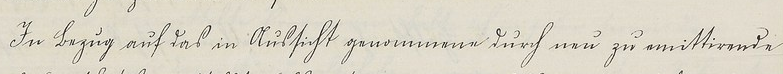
In Bezug auf das in Aussicht genommene durch neu zu emittirende
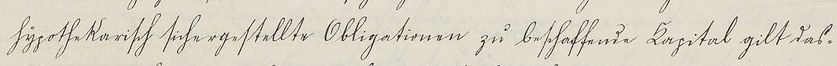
hypothekarisch sichergestellte Obligationen zu beschaffende Kapital gilt das-
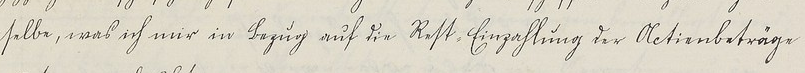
selbe, was ich mir in Bezug auf die Rest-Einzahlung der Actienbeträge
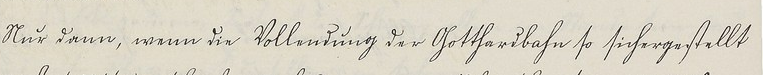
Nur dann, wenn die Vollendung der Gotthardbahn so sichergestellt
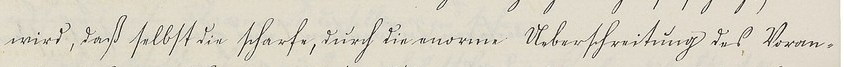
wird, daß selbst die scharfe, durch die enorme Ueberschreitung des Voran-
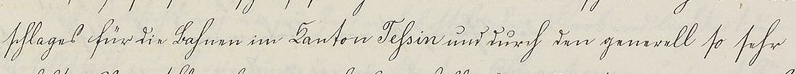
schlages für die Bahnen im Kanton Tessin und durch den generell so sehr
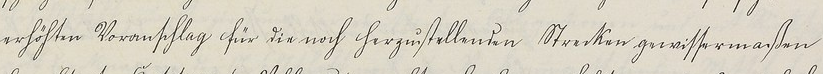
erhöhten Voranschlag für die noch herzustellenden Strecken gewissermaßen
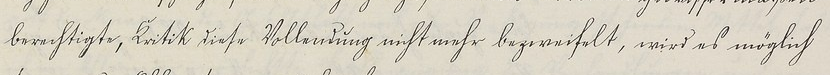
berechtigte, Kritik diese Vollendung nicht mehr bezweifelt, wird es möglich
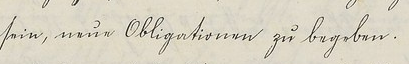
sein, neue Obligationen zu begeben.
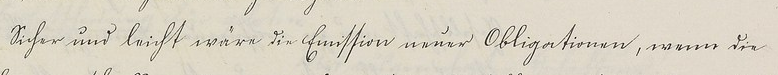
Sicher und leicht wäre die Emission neuer Obligationen, wenn die
